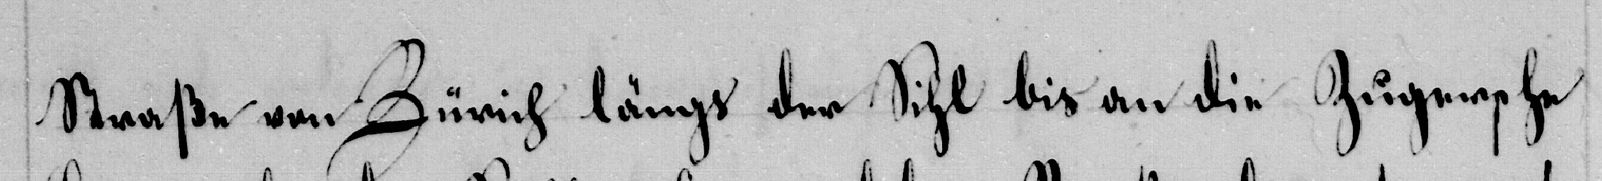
Straße von Zürich längs der Sihl bis an die Zugersche
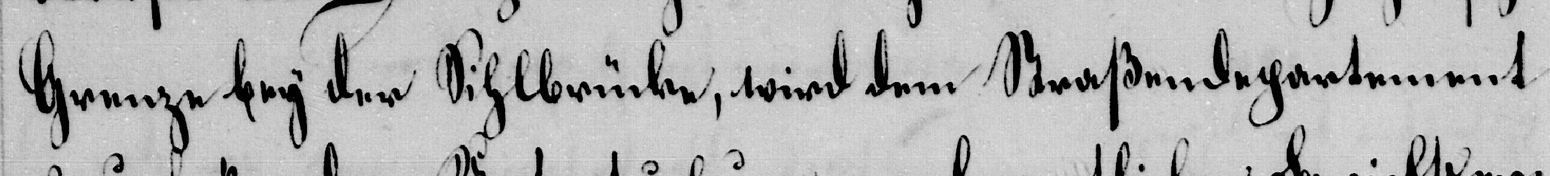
Grenze bey der Sihlbrücke, wird dem Straßendepartement
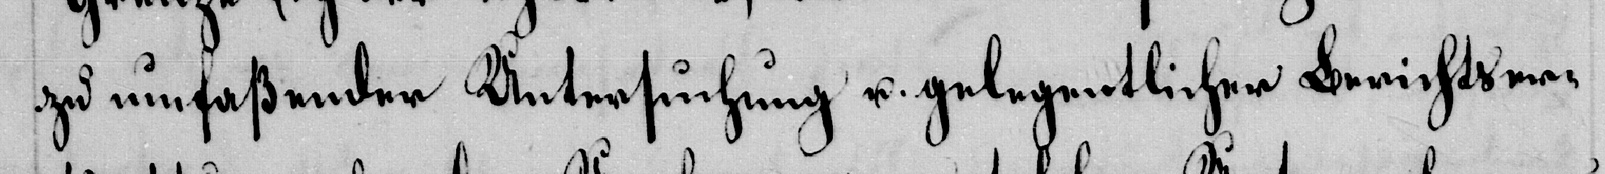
zu umfaßender Untersuchung u. gelegentlicher Berichtser¬
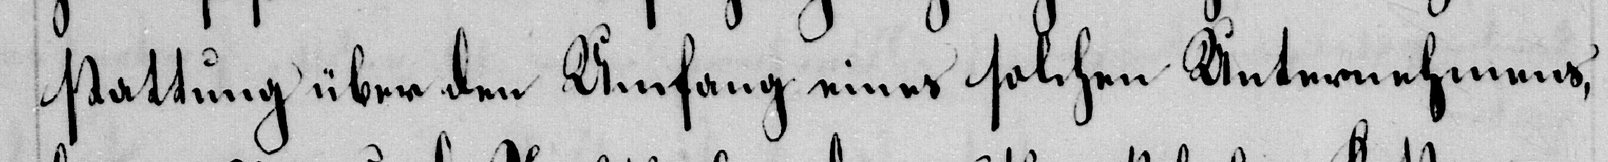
stattung über den Umfang eines solchen Unternehmens,
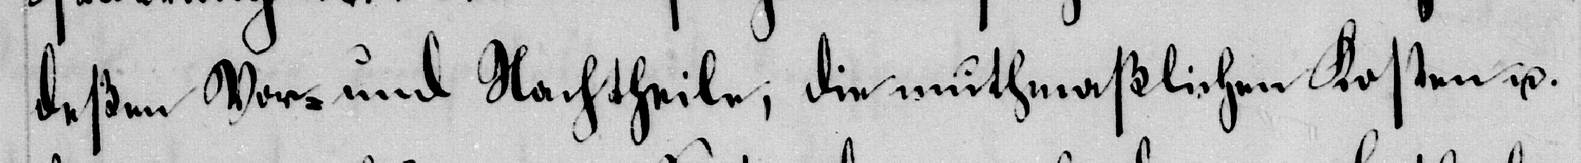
deßen Vor- und Nachtheile, die muthmaßlichen Kosten u.
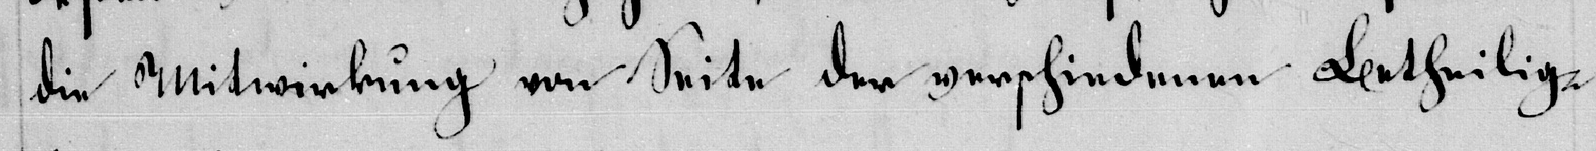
die Mitwirkung von Seite der verschiedenen Betheilig¬
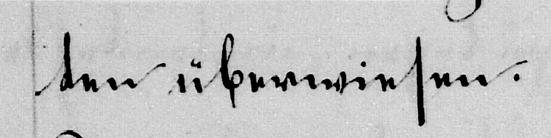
ten überwiesen.
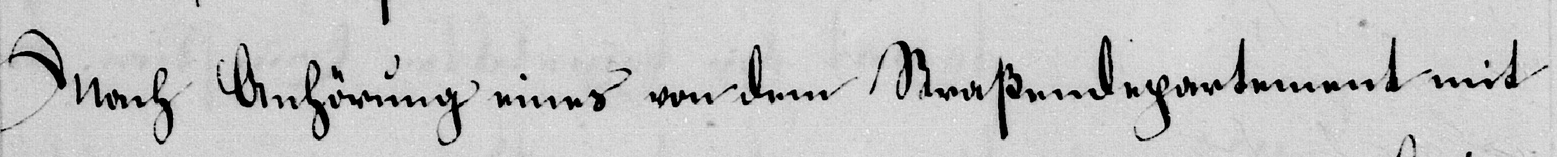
Nach Anhörung eines von dem Straßendepartement mit
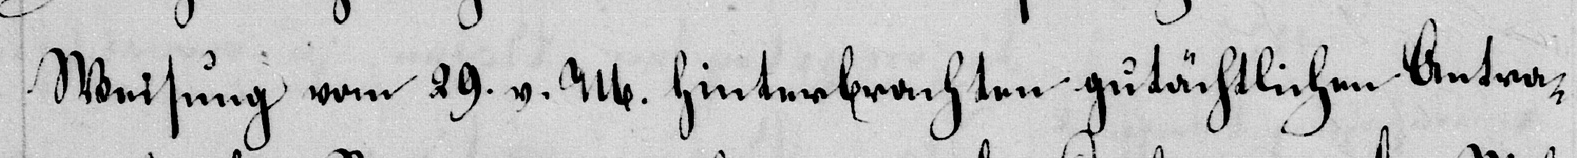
Weisung vom 29. v. M. hinterbrachten gutächtlichen Antra¬
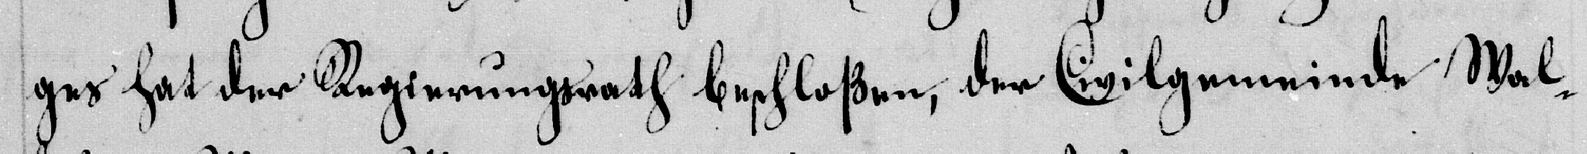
ges hat der Regierungsrath beschloßen, der Civilgemeinde Wal¬
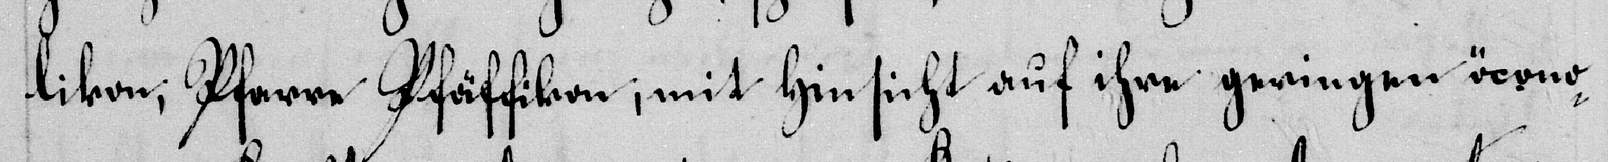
likon, Pfarre Pfäffikon; mit Hinsicht auf ihre geringen öcono¬
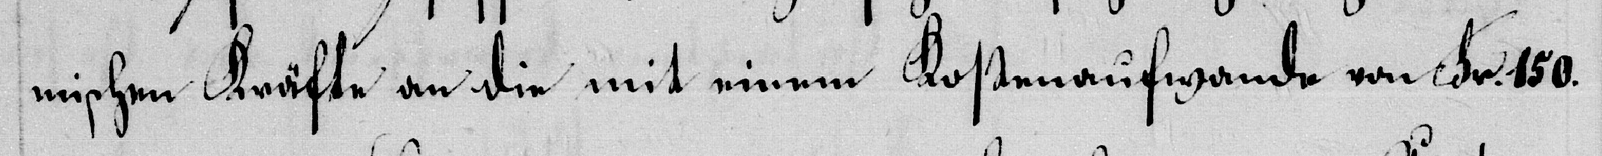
mischen Kräfte an die mit einem Kostenaufwande von Fr. 150.
